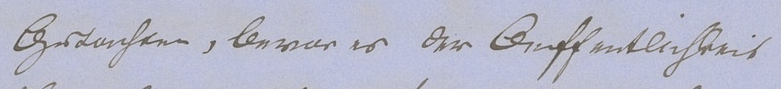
Gutachten, bevor es der Oeffentlichkeit
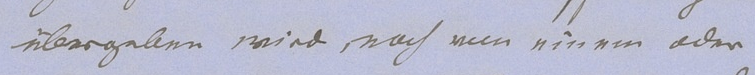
übergeben wird, noch von einem oder
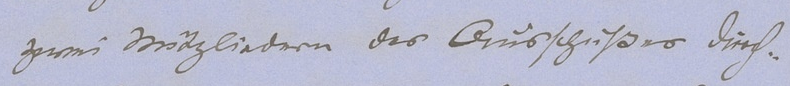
zwei Mitgliedern des Ausschußes durch-
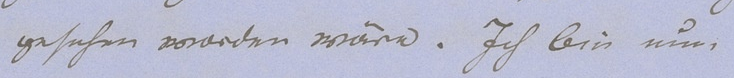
gesehen worden wäre. Ich bin nun
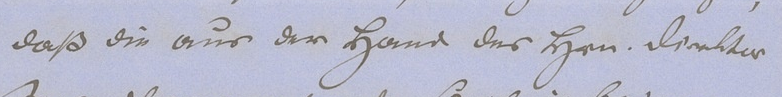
daß die aus der Hand des Hrn. Direktor
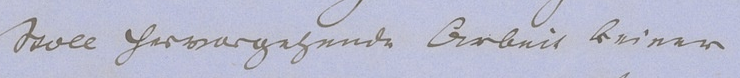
Stoll hervorgehende Arbeit keiner
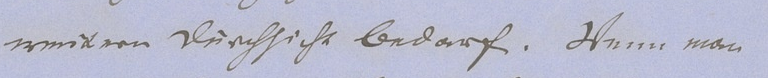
weitern Durchsicht bedarf. Wenn man
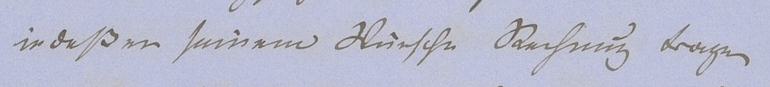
indeßen seinem Wunsche Rechnung tragen
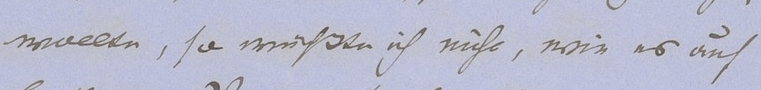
wollte, so wüßte ich nicht, wie es auf
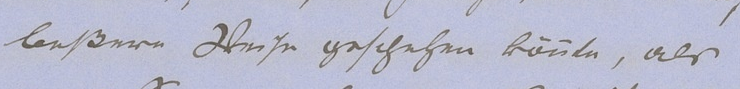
beßere Weise geschehen könnte, als
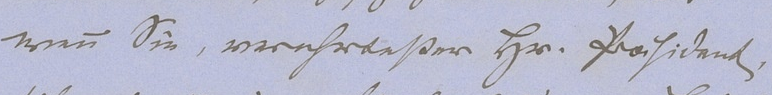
wenn Sie, verehrtester Hr. Präsident,
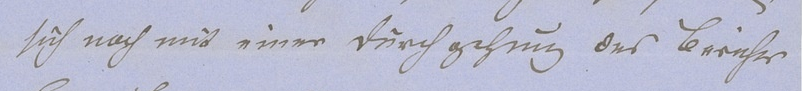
sich noch mit einer Durchgehung des Briefes
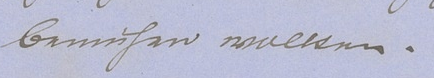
bemühen wollten. –
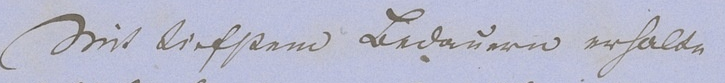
Mit tiefstem Bedauern erhalte
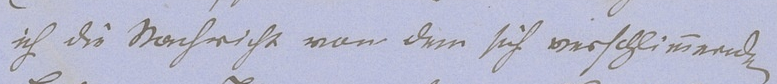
ich die Nachricht von dem sich verschlimmernden
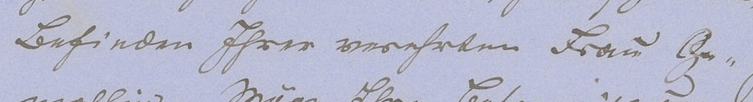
Befinden Ihrer verehrten Frau Ge-
